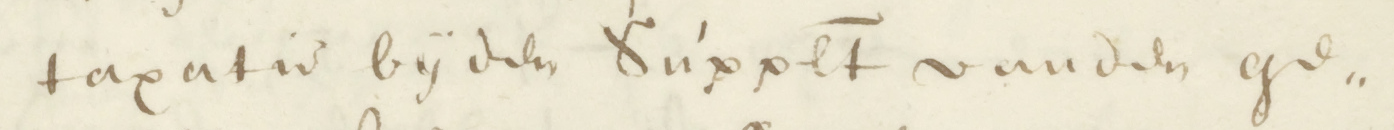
taxatie bij den Supplt vanden ge„
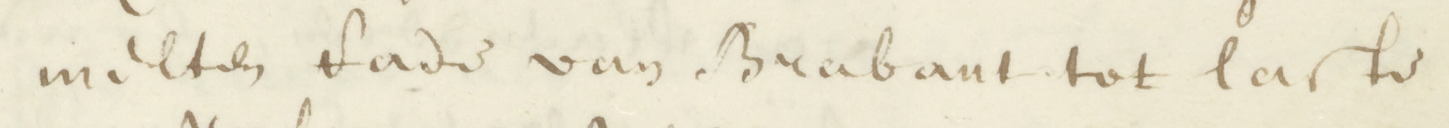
melten Rade van Brabant tot laste
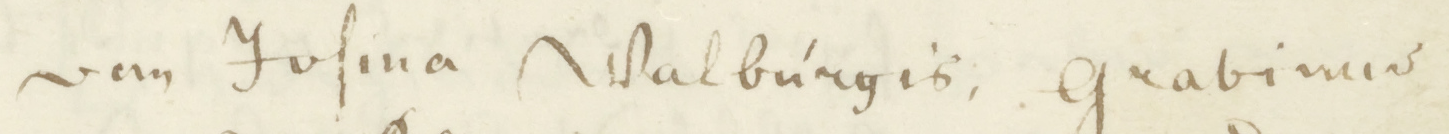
van Josina Walburgis, Gravinne
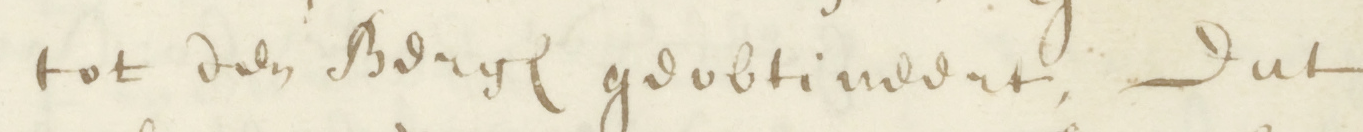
tot den Bergh geobtineert. Dat
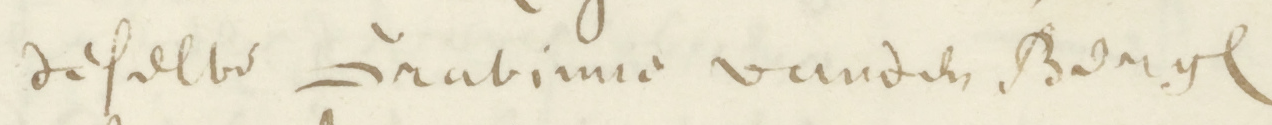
deselve Gravinne vanden Bergh
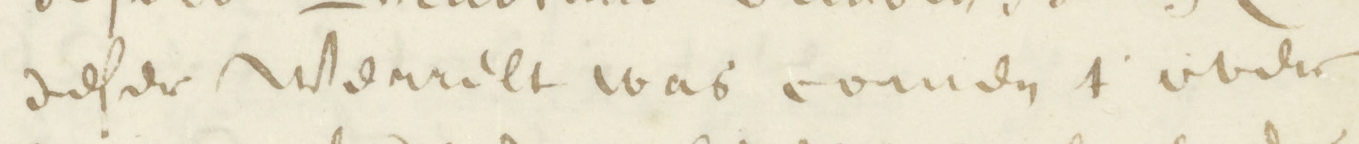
deser Werrelt was comen t‛over„
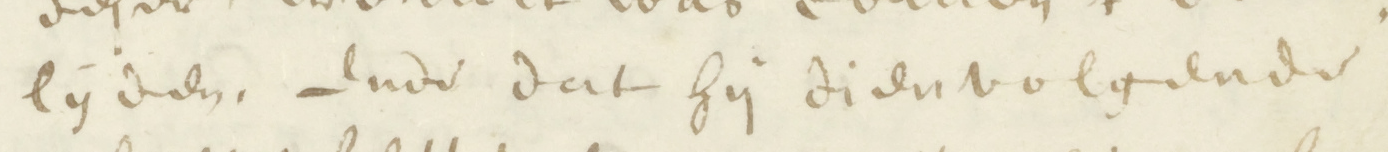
lijden, ende dat hij dienvolgende
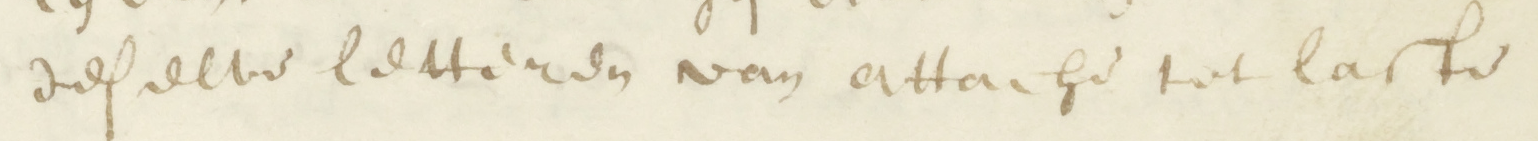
deselve letteren van attache tot laste
